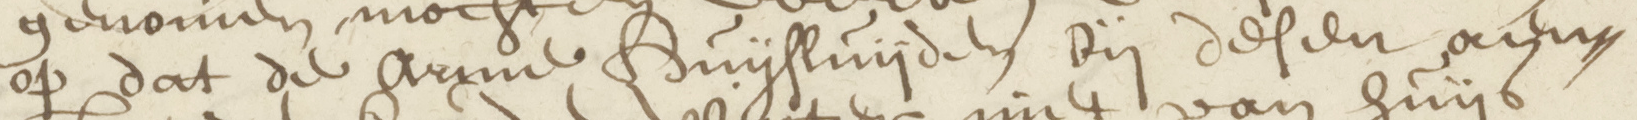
op dat de Arme Huijsluijden bij desen aen„
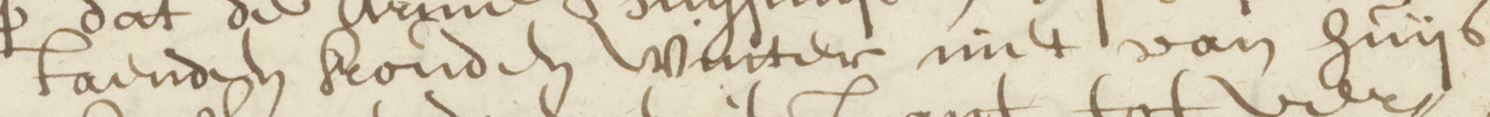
staenden kouden Winter niet van huijs
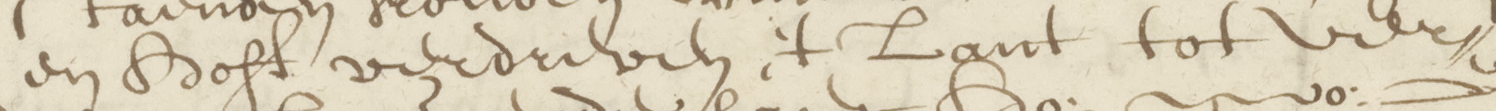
en Hoff verdreven, ‛t Lant tot ver„
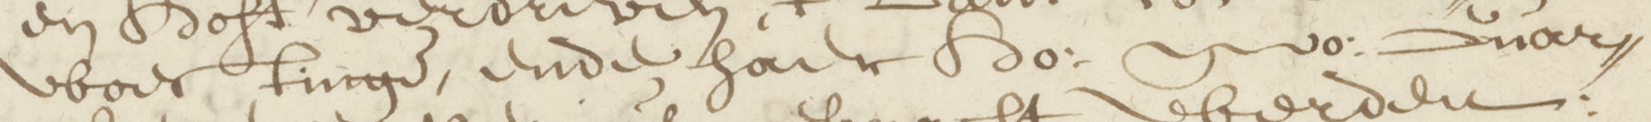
woestinge, ende haer Ho:Mo: Guar„
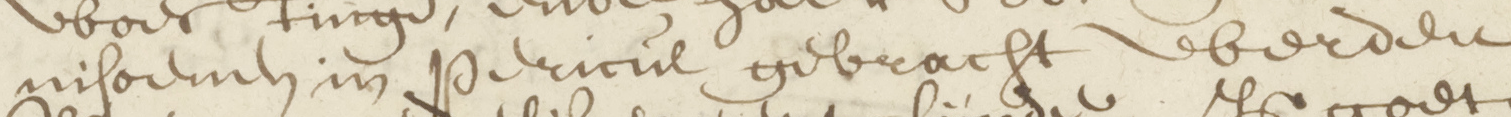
nisoenen in Pericul gebracht werden:
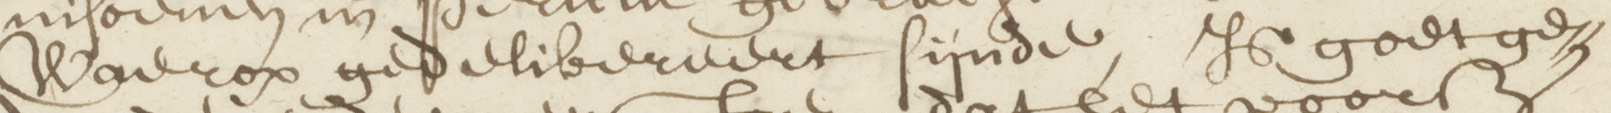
Waerop gedelibereert sijnde, Is goetge„
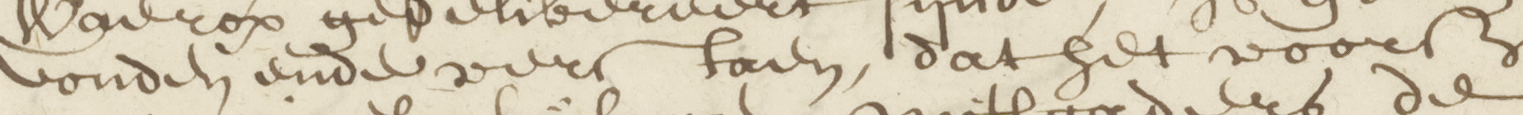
vonden ende verstaen, dat het voorss
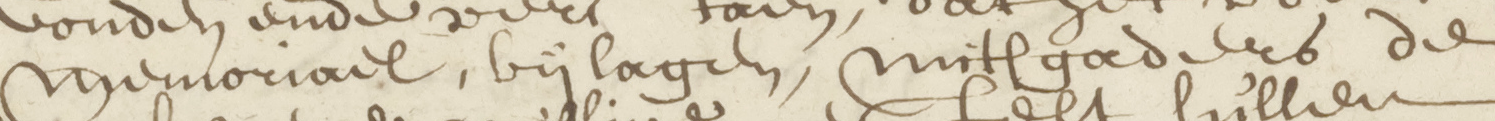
memoriael, bijlagen, mitsgaders de
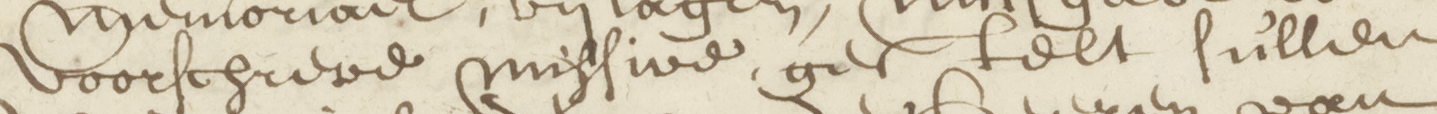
voorschreve missive, gestelt sullen
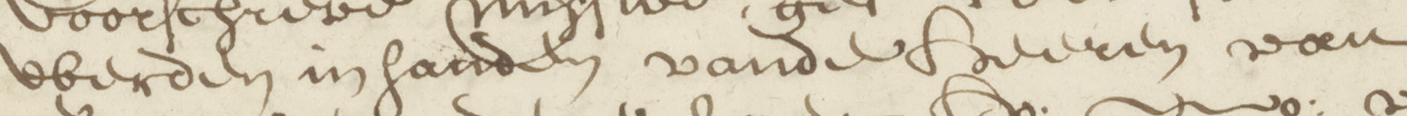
werden in handen vande Heeren van
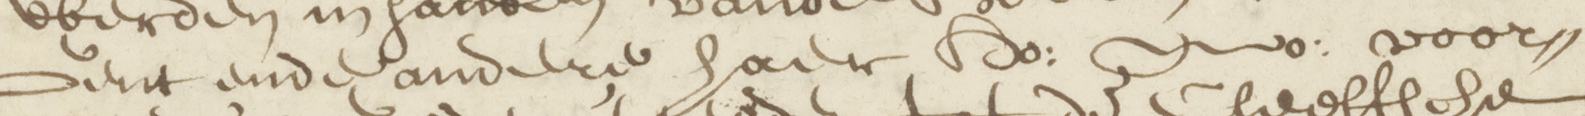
Gent ende andere haer Ho:Mo: voor„
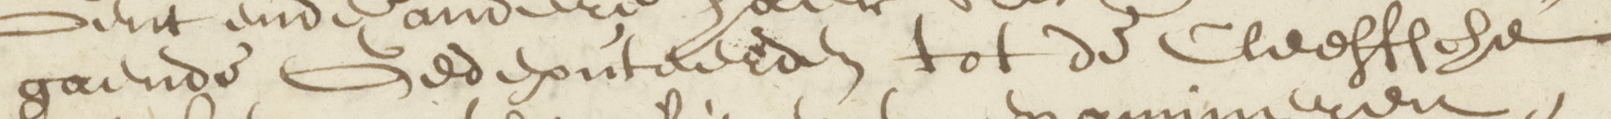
gaende Gedeputeerden tot de Cleeffsche
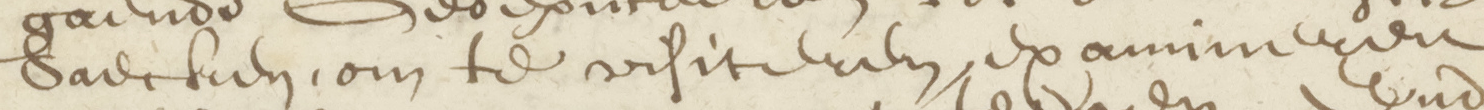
Saecken, om te visiteren, examineren,
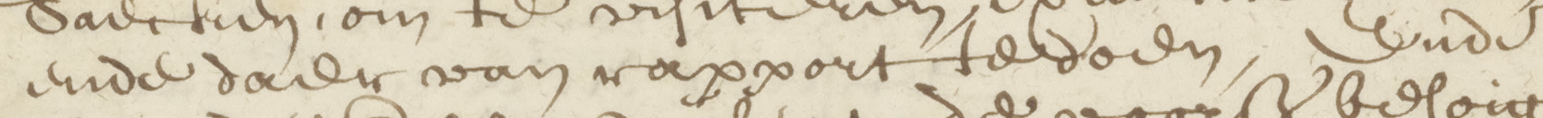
ende daer van rapport te doen, Ende
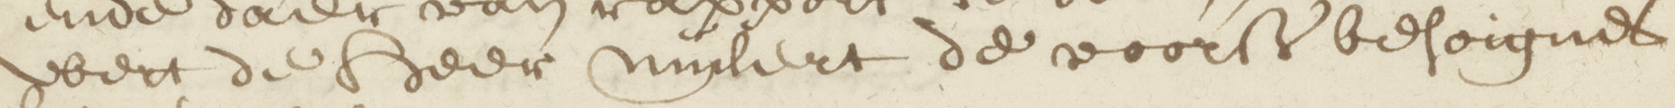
wert de Heer Mulert de voorss besoignes
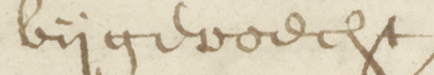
bijgevoecht.
